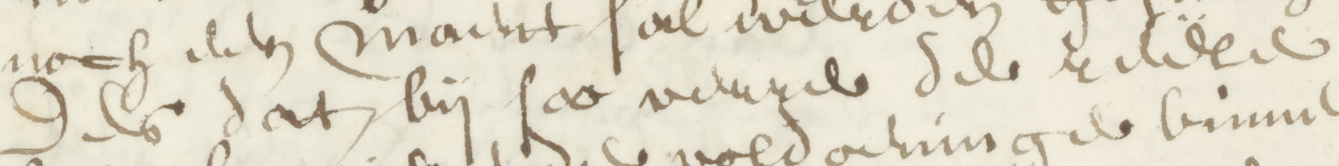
Des dat bij soo verre de reele
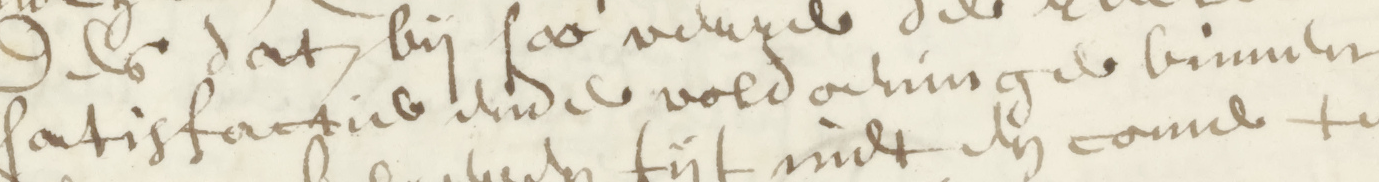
satisfactie ende voldoeninge binnen
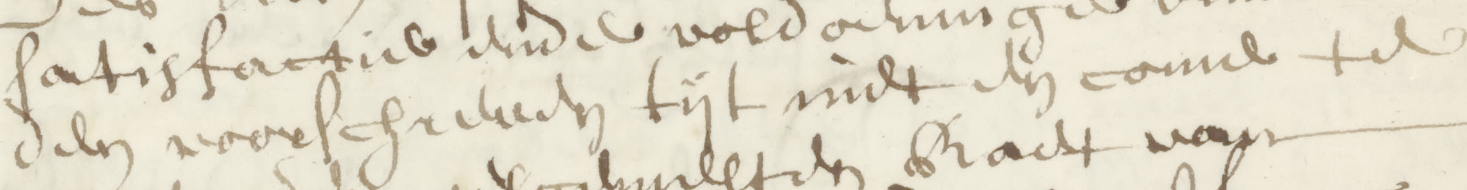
den voorschreven tijt niet en come te
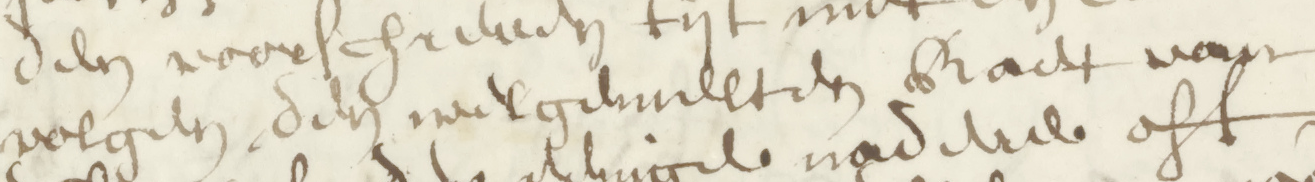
volgen, den welgemelten Raet van
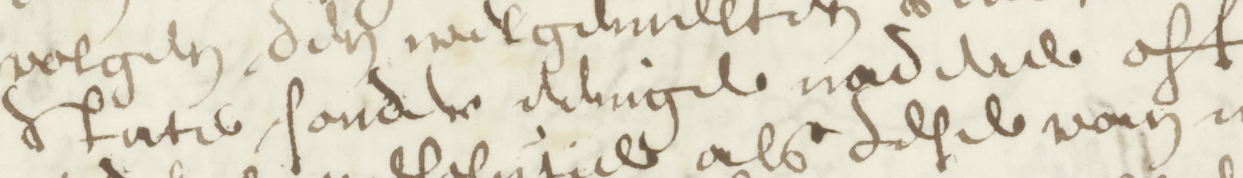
State, sonder eenige nadere off
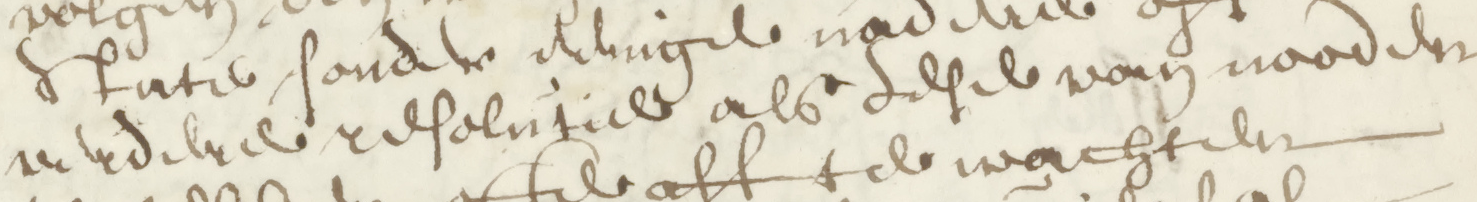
verdere resolutie als dese van nooden
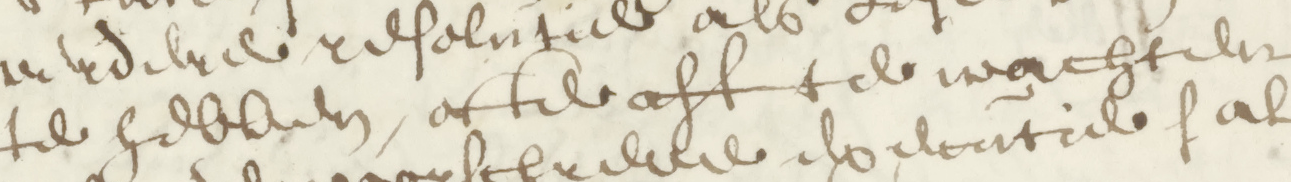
te hebben, ofte aff te wachten
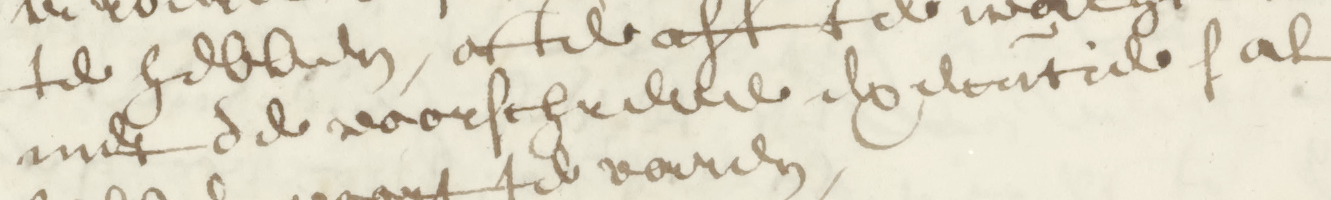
met de voorschreve executie sal
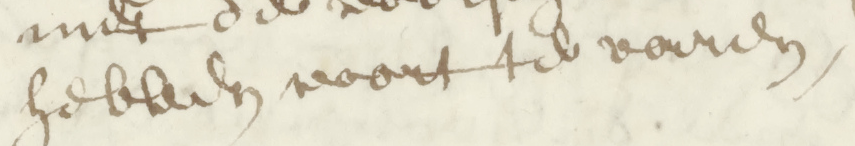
hebben voort te varen.
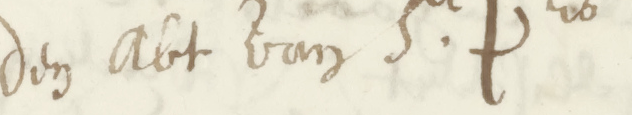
den Abt van St. Prs
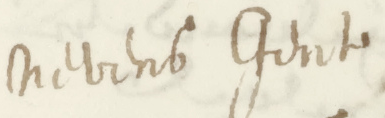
nevens Gent
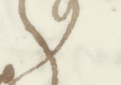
ca.
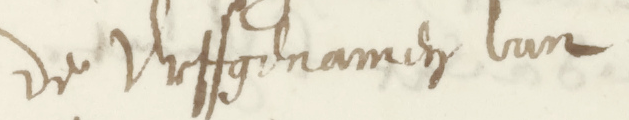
de Erffgenamen van
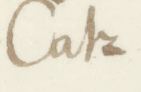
Catz
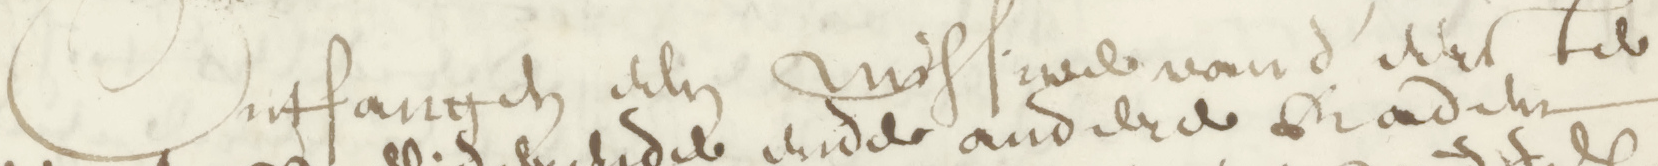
Ontfangen een Missive van d‛eerste
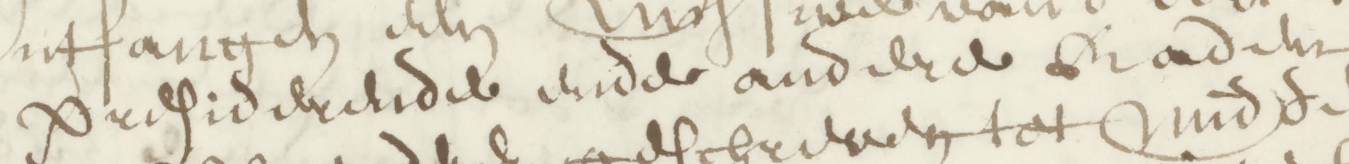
presiderende ende andere Raden
